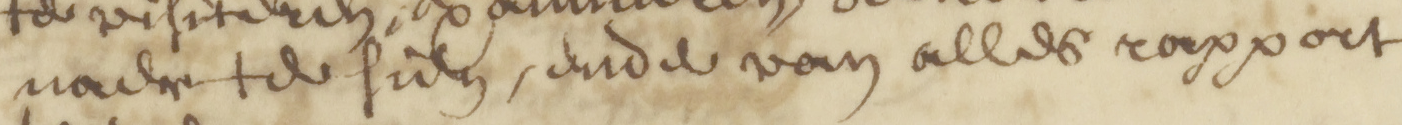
naer te sien, ende van alles rapport
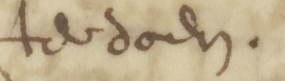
te doen.
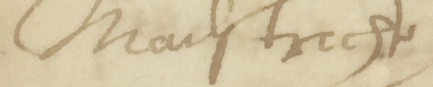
Maestricht
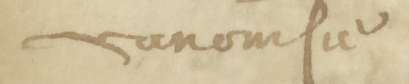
canonisie
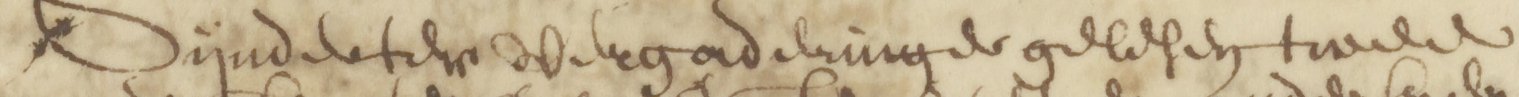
Sijnde ter Vergaderinge gelesen twee
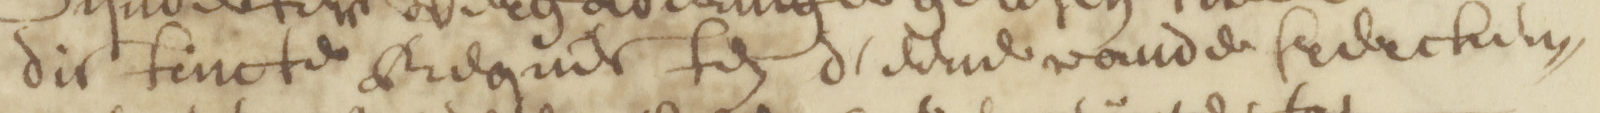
distincte Requesten d‛eene vande kercken„
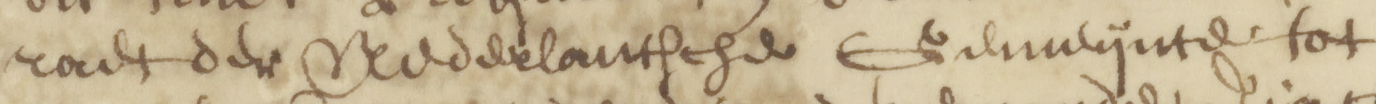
raet der Nederlantsche Gemeijnte tot
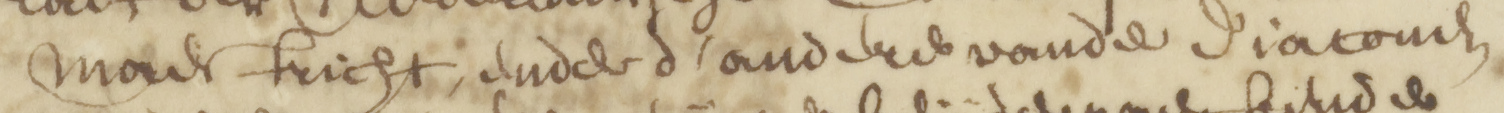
maestricht, ende d'andere vande Diaconen
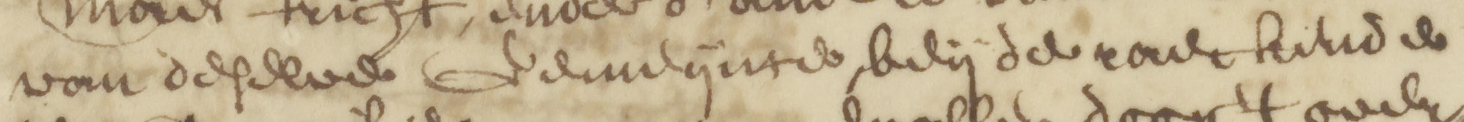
van deselve Gemeijnte, beijde raeckende
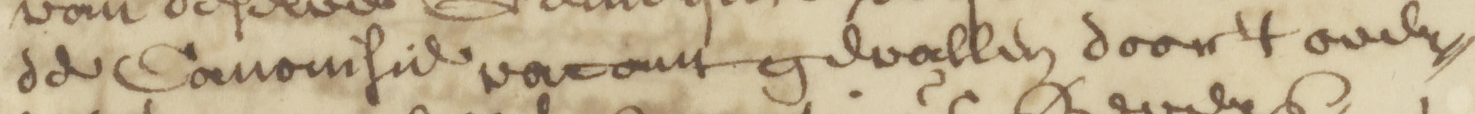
de Canonisie vacant gevallen door 't over„
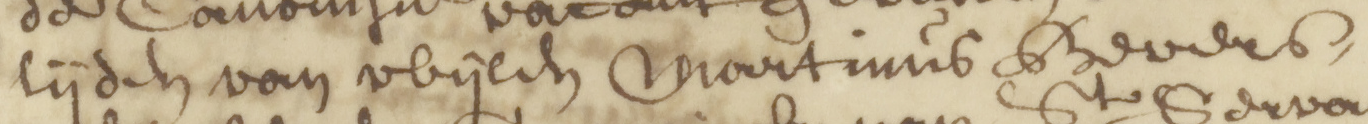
lijden van wijlen Martinus Bevers,
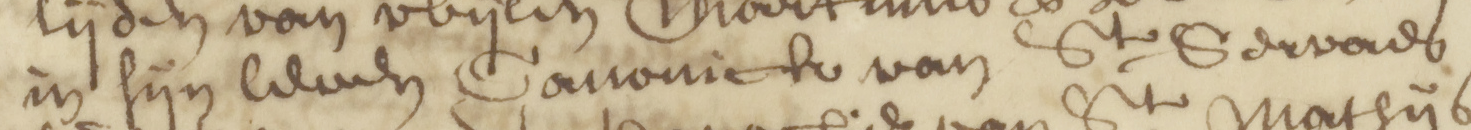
in sijn leven Canonick van St. Servaes
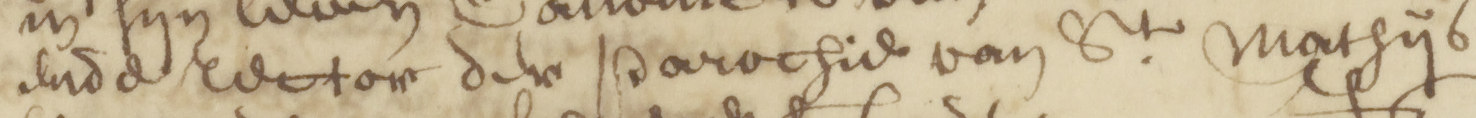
ende rector der Parochie van St. Mathijs
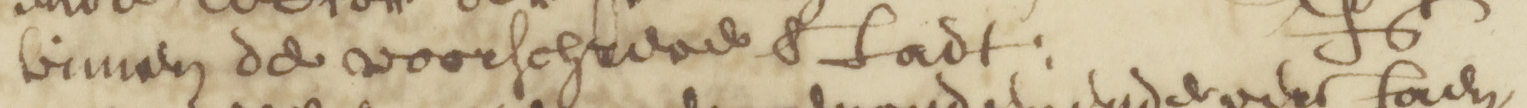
binnen de voorschreve Stadt: Is
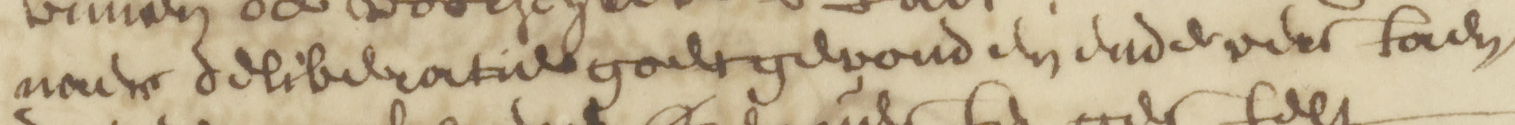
naer deliberatie goetgevonden ende verstaen,
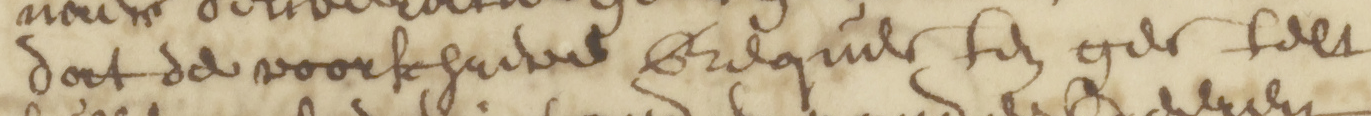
dat de voorschreve Requesten gestelt
